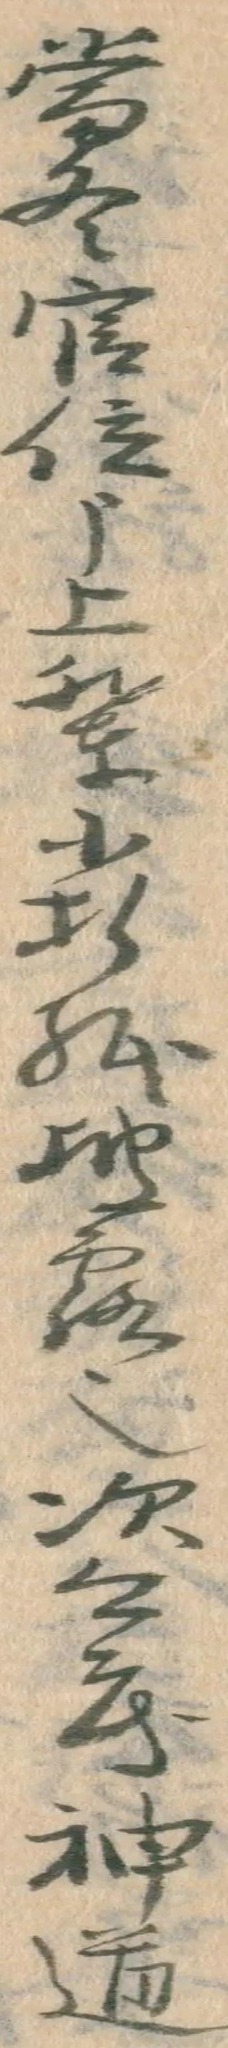當冬官位申上輩、小折紙披露也、次今度神道
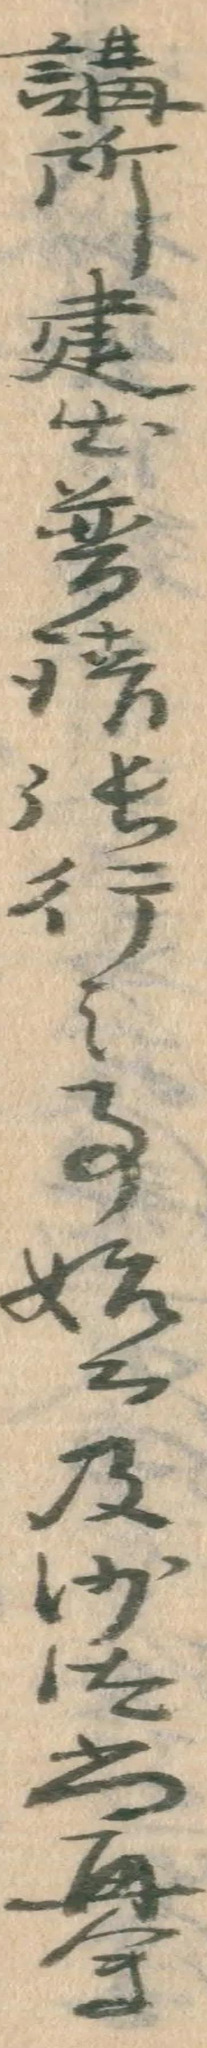講所建出普請張行之事、始而及沙汰、尚再會
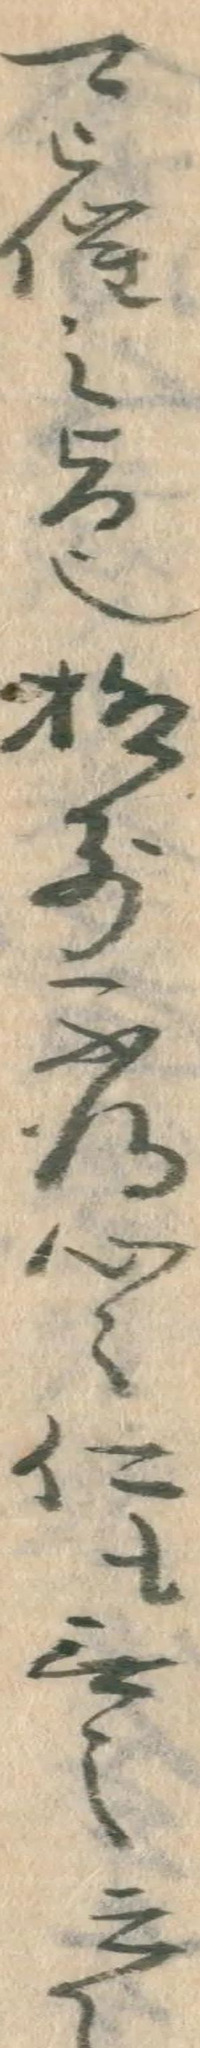可被催之旨也、格別不得心之仁も無之云々、
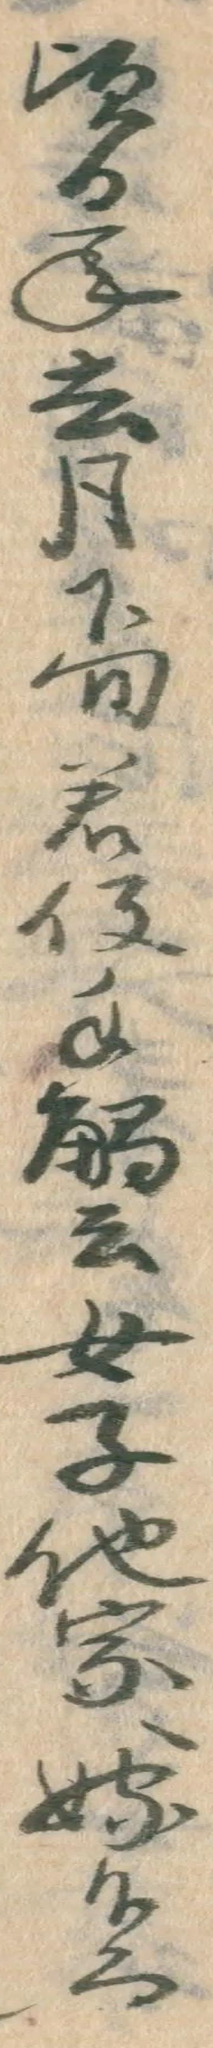頃日年、去月下旬若役手触云、女子他家へ嫁候而
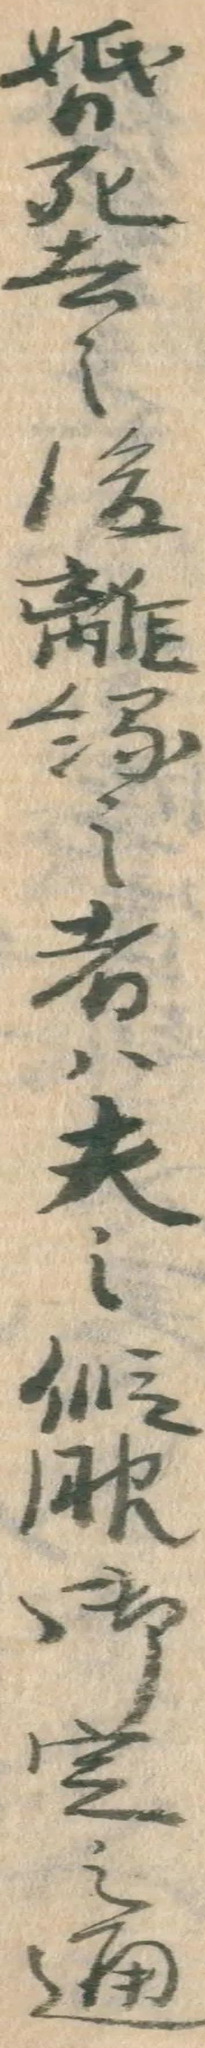婚死去之後離縁之者ハ、夫之假服、御定之通
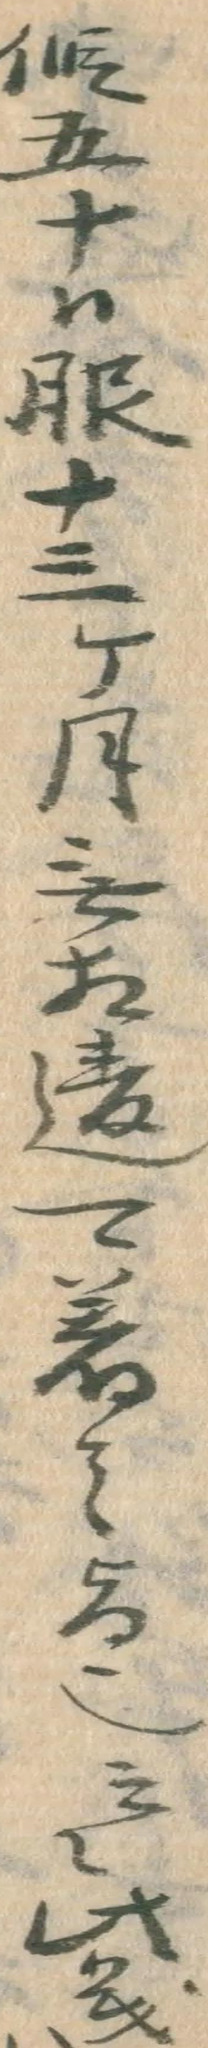假五十日・服十三ヶ月無相違可着之旨也云々、此義ハ
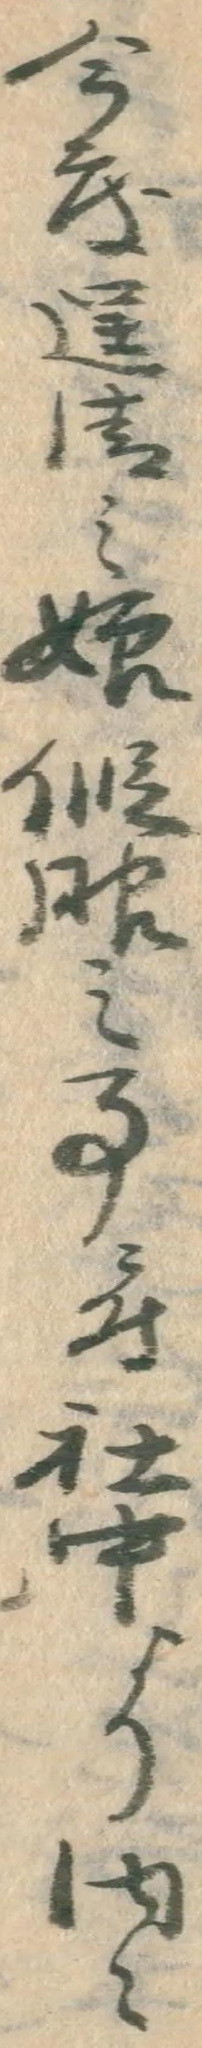今度逞清之娘假服之事ニ付、社中より内々
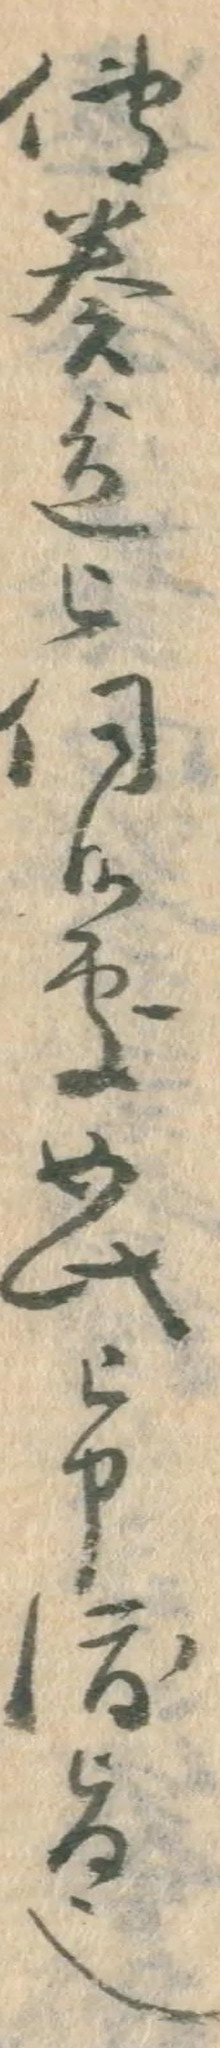傳奏迄被伺候處、如此被申渡旨也、
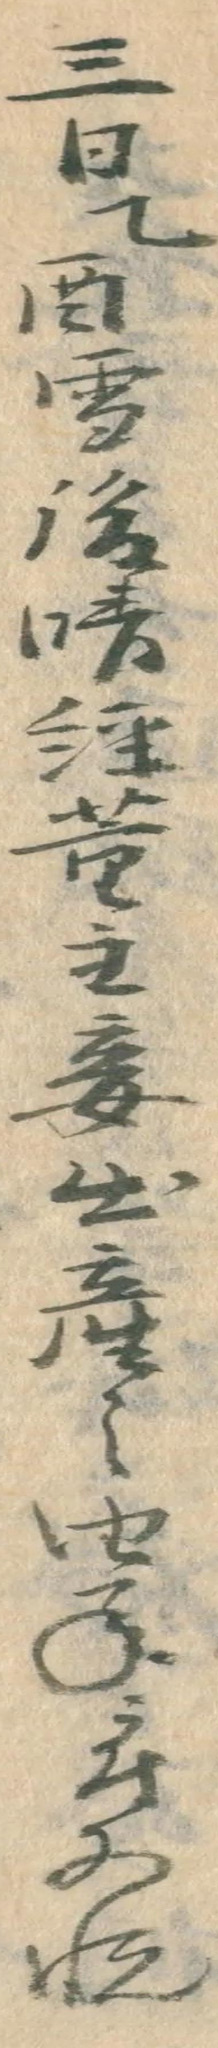三日乙酉雪後晴、経董主妾出産之由承ニ付為祝
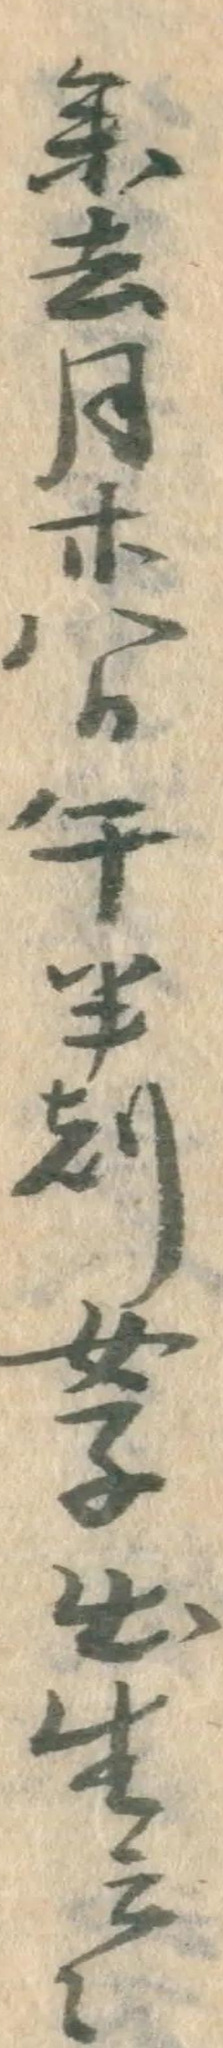参、去月廿八日午半刻女子出生云々、
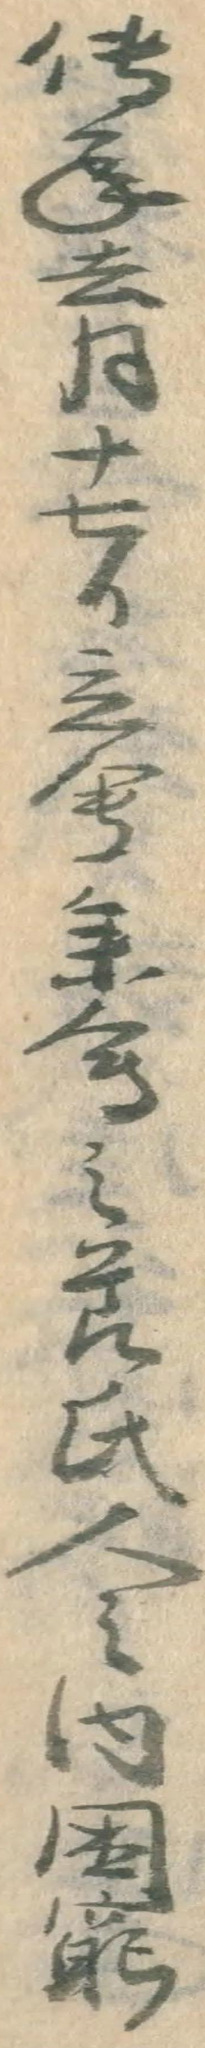傳承、去月十七日立會参会之節、氏人之内困窮

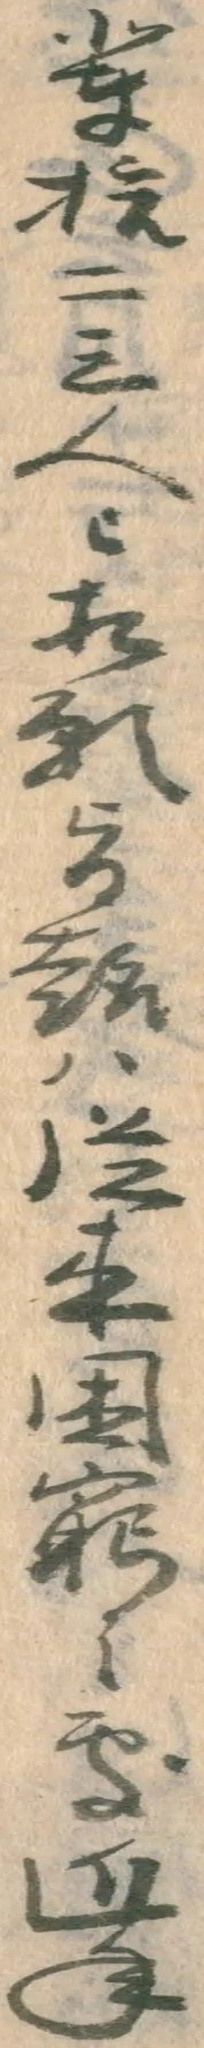輩杭二三人被相願、旨趣ハ従来困窮之處、近年
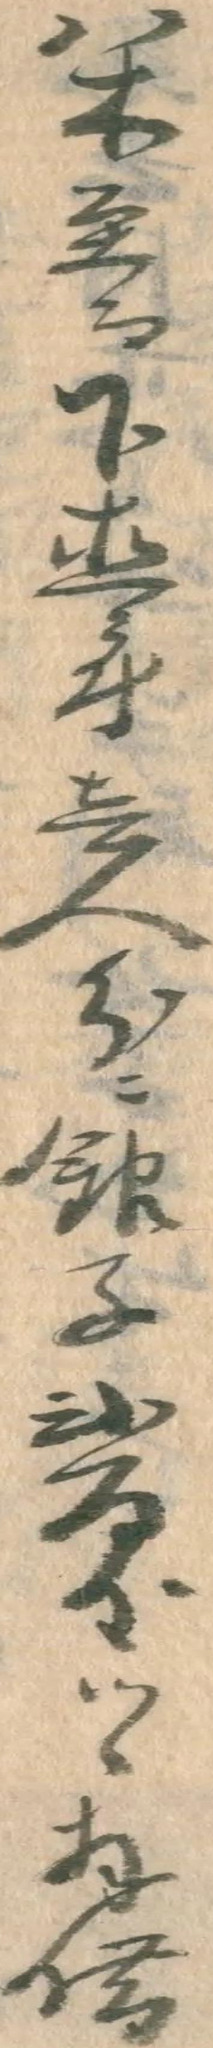米至而下直ニ付、壱人分ニ銀子弐百匁ツヽ拝借
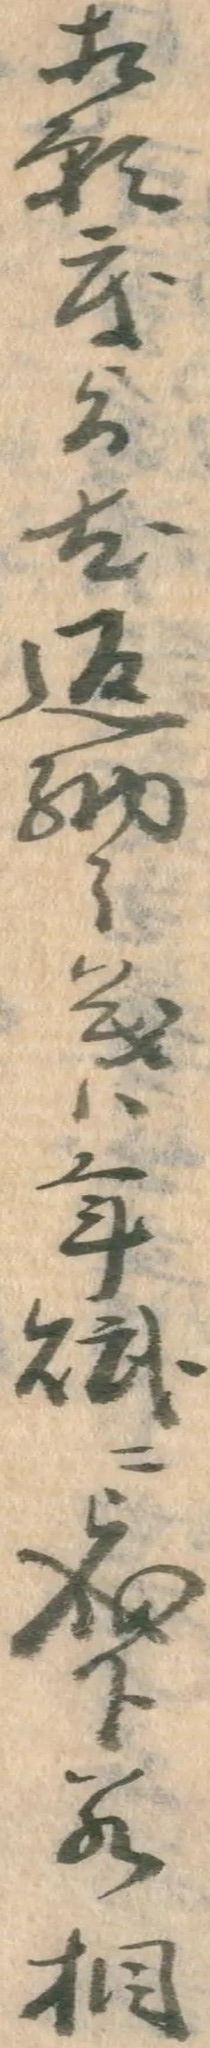相願度旨、尤返納之義ハ年賦ニ被成下、若相
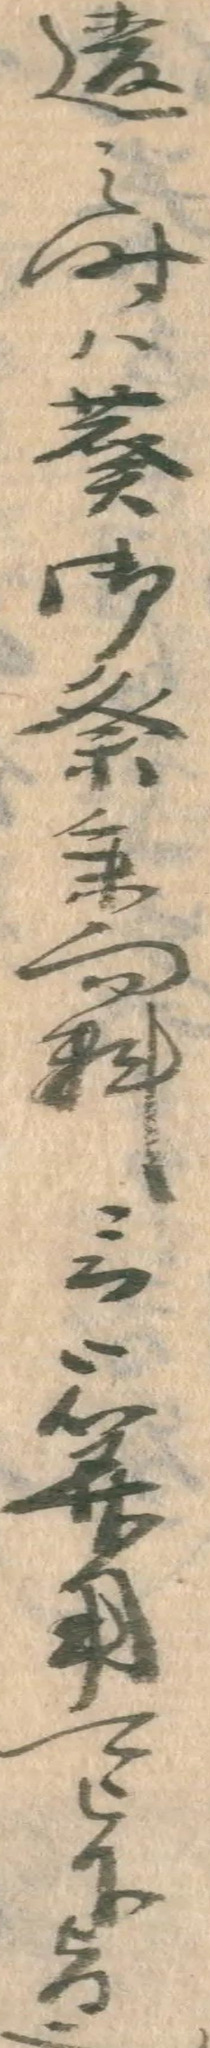違之時ハ、葵御祭参向料ニ而ハ算用可被下旨也
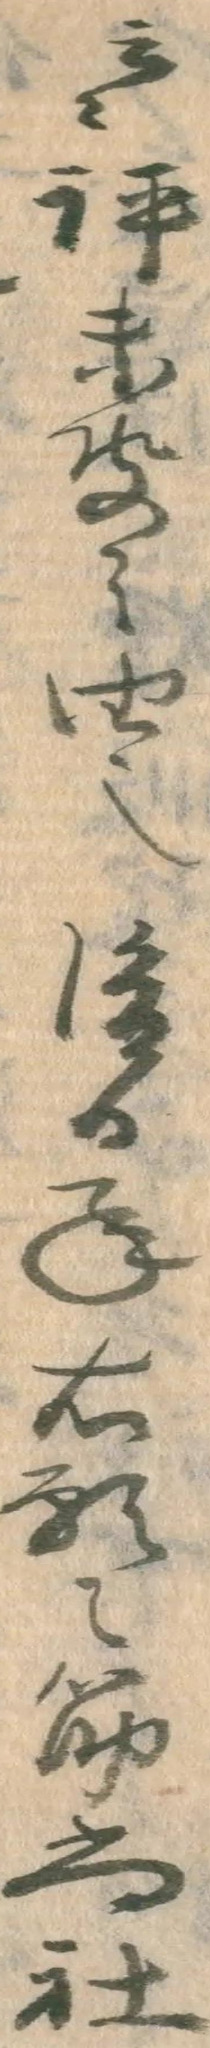云々、評未決之由也、後日年右願之筋、尚社
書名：賀茂社記録. 第63冊
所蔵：国立国会図書館 National Diet Library, JAPAN
